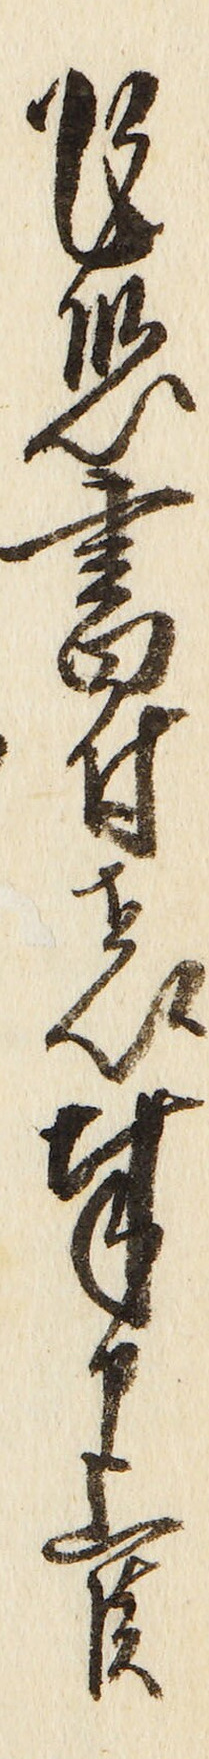乍恐書付を以奉申上候
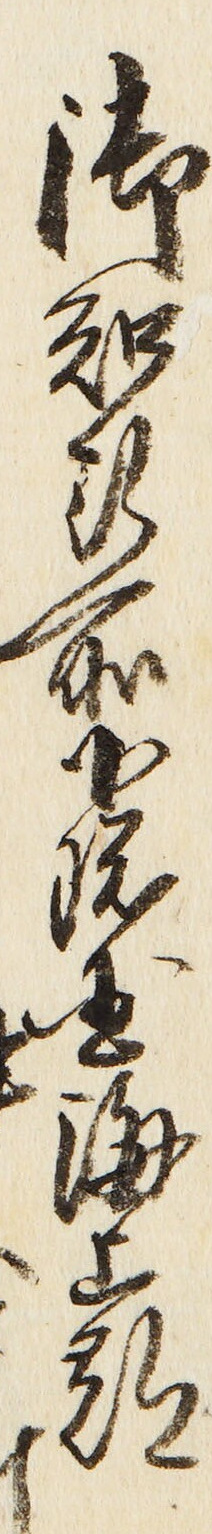御知行所下総国海上郡
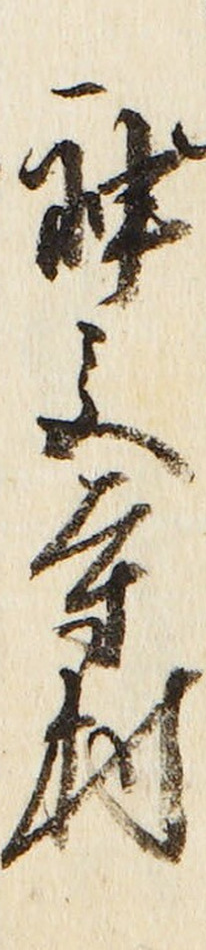神宮寺村
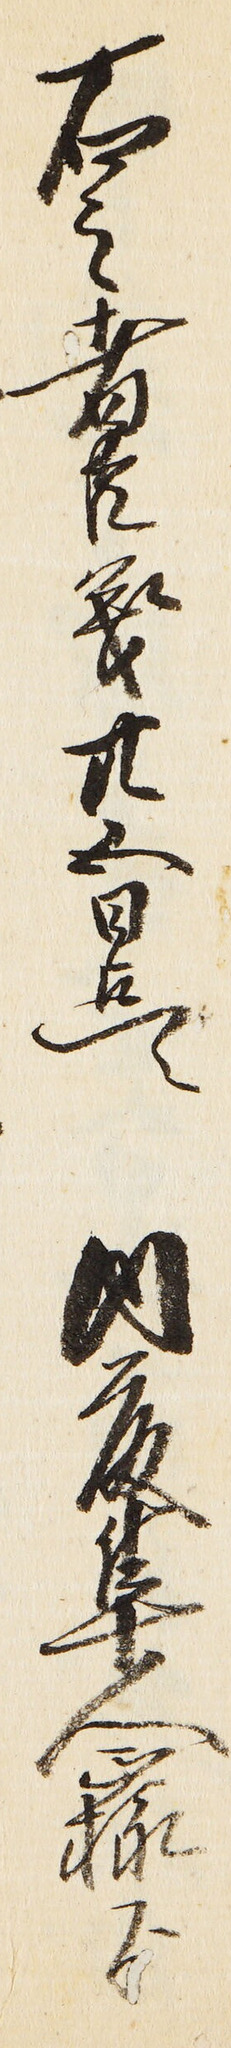右之者共義廿五日迄ニ内藤隼人正様ゟ
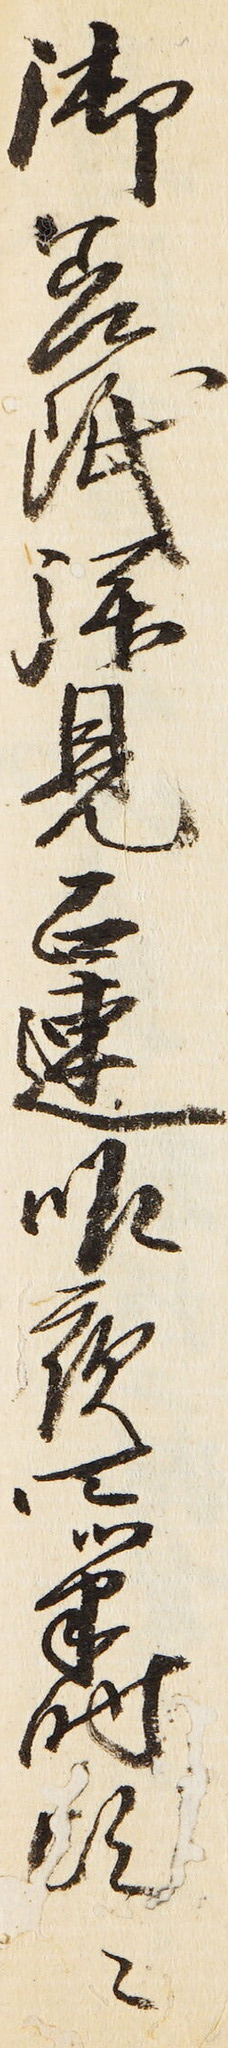御差紙拝見召連昨夜四ツ半時頃ニ
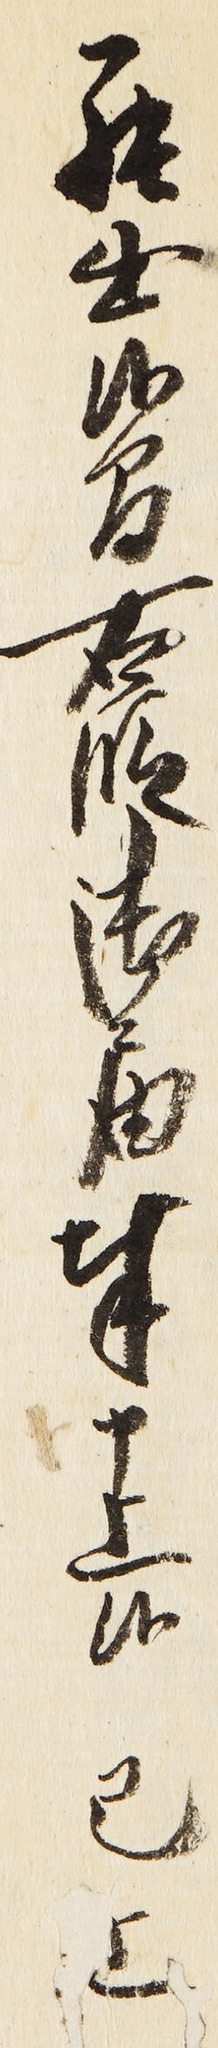罷出候間右段御届奉申上候已上
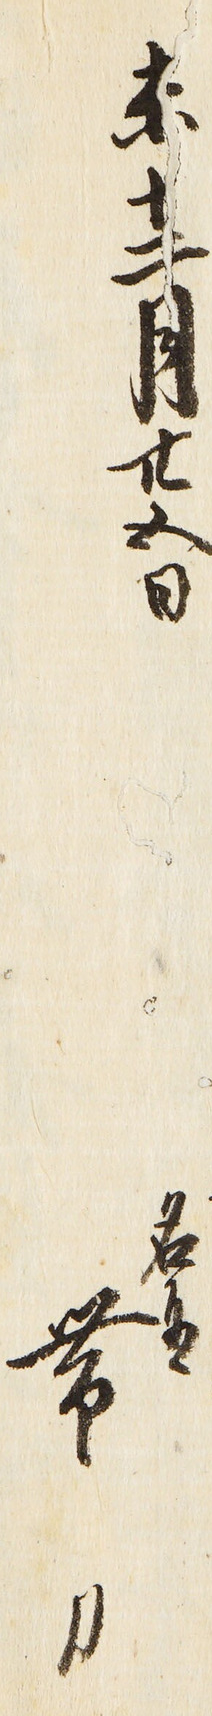未十二月廿五日右村
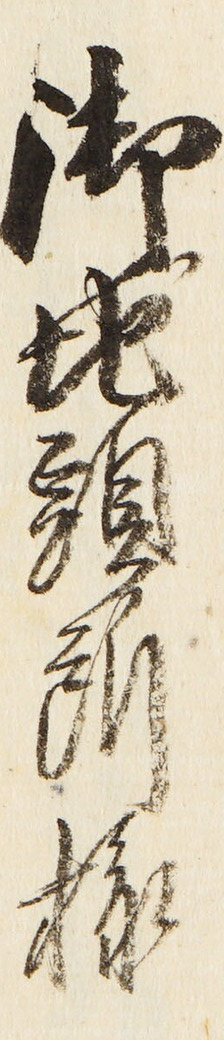御地頭所様
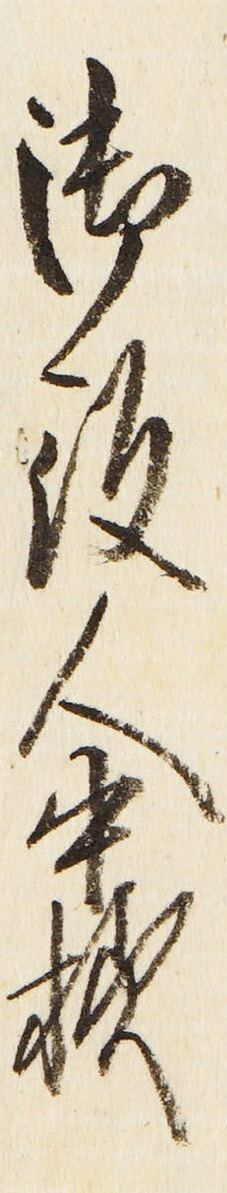御役人中様

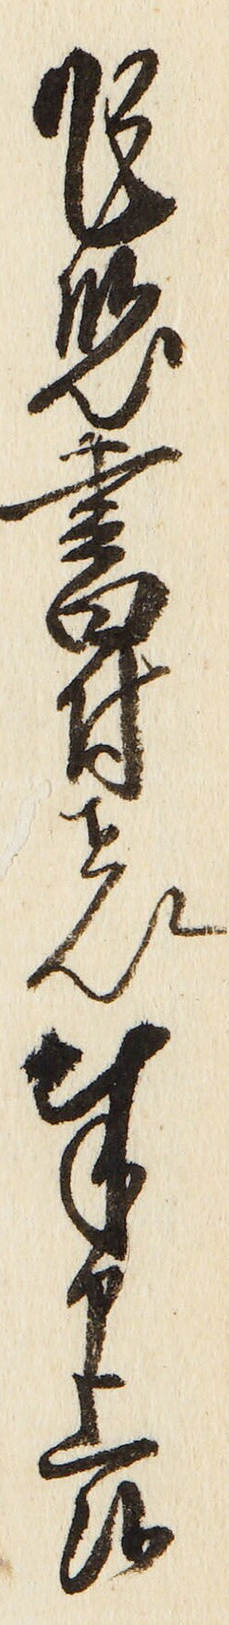乍恐書付を以奉申上候
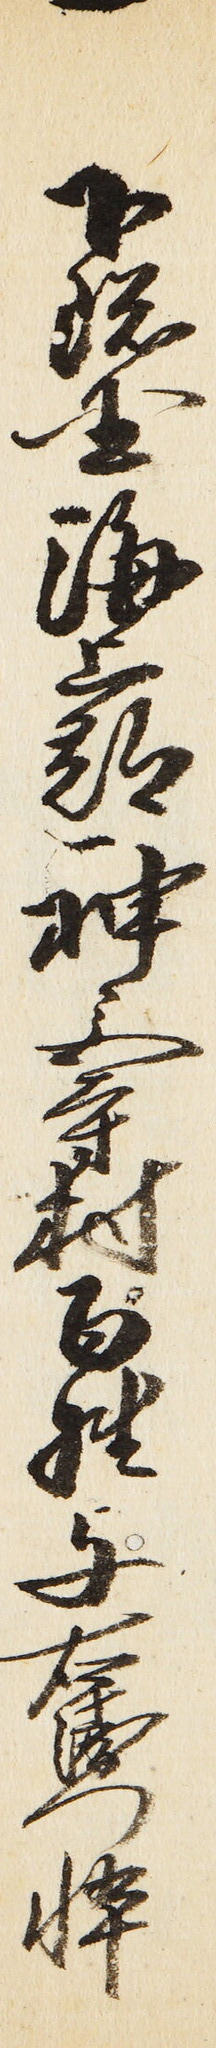一下総国海上郡神宮寺村百姓与右衛門忰
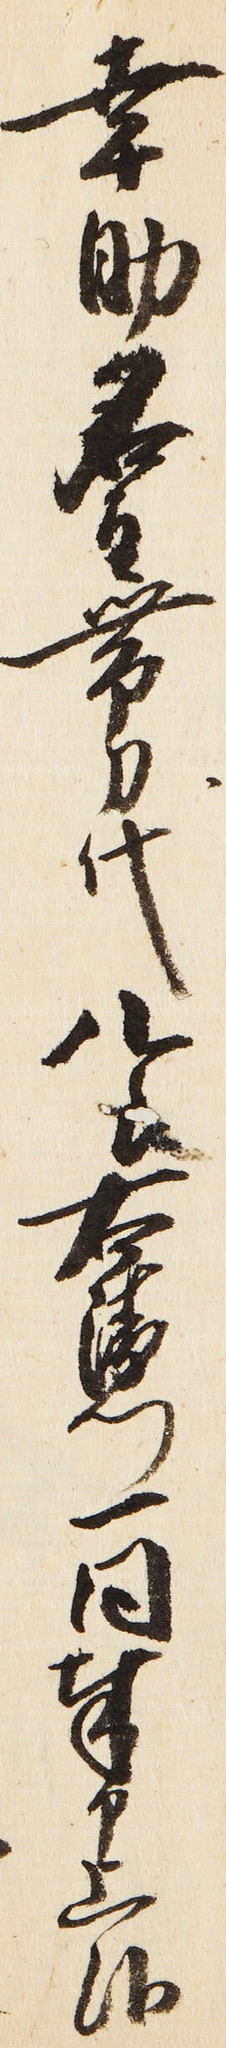幸助名主帯刀代八郎右衛門一同奉申上候
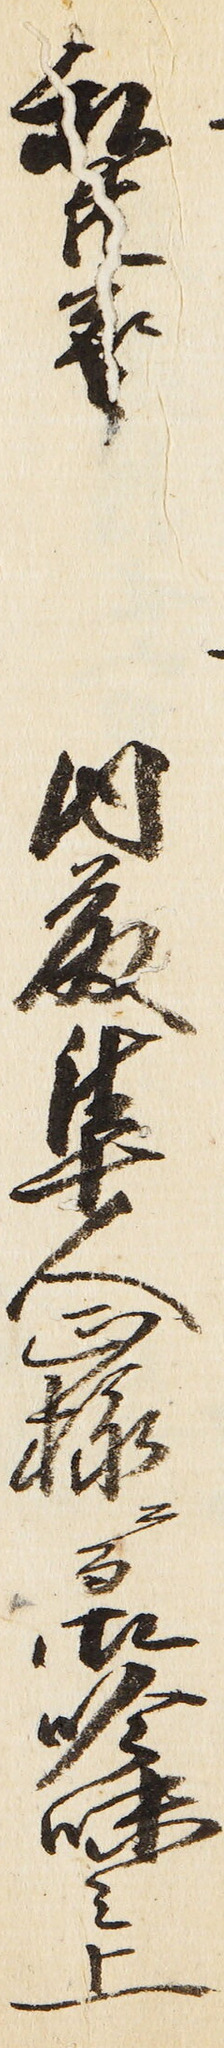私共義内藤隼人正様ニ而御吟味之上
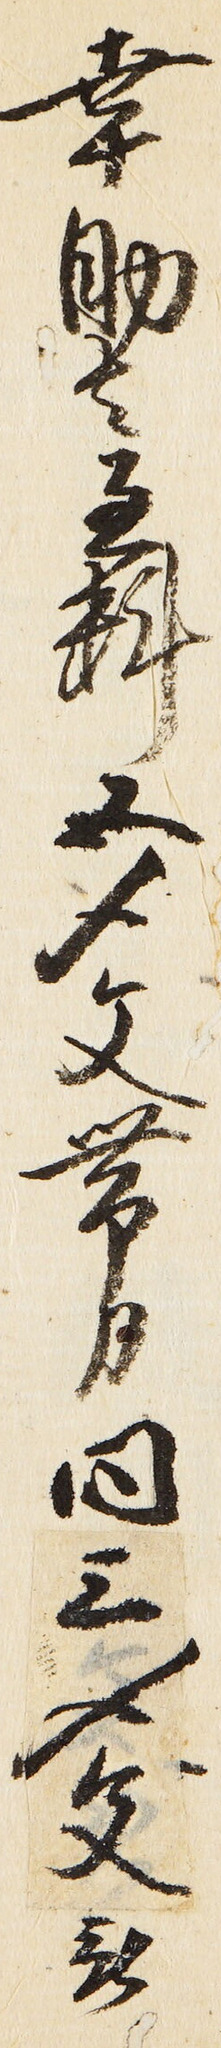幸助者過料五貫文帯刀同三貫文被
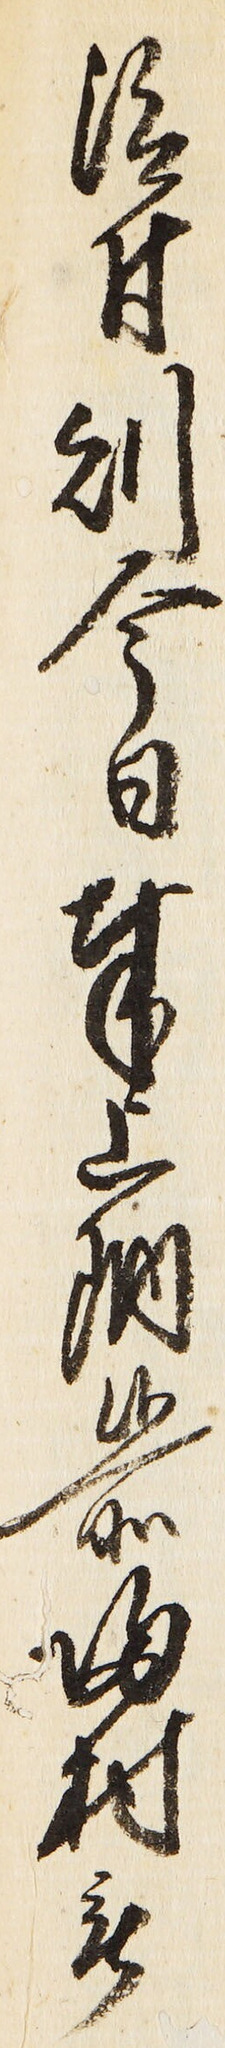仰付則今日奉上納候所帰村被
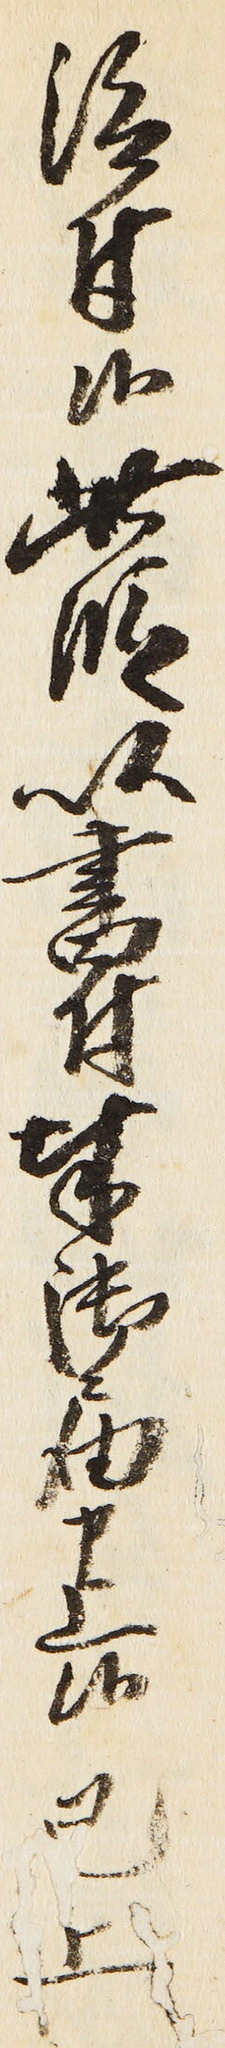仰付候此段以書付奉御届申上候已上
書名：難船一件記録
